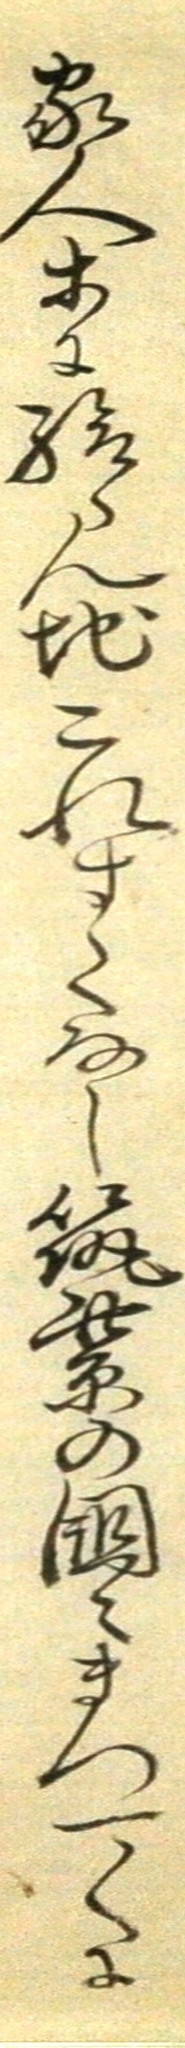家人等に給らん地これすくなし筑紫の国々まつ一〳〵に
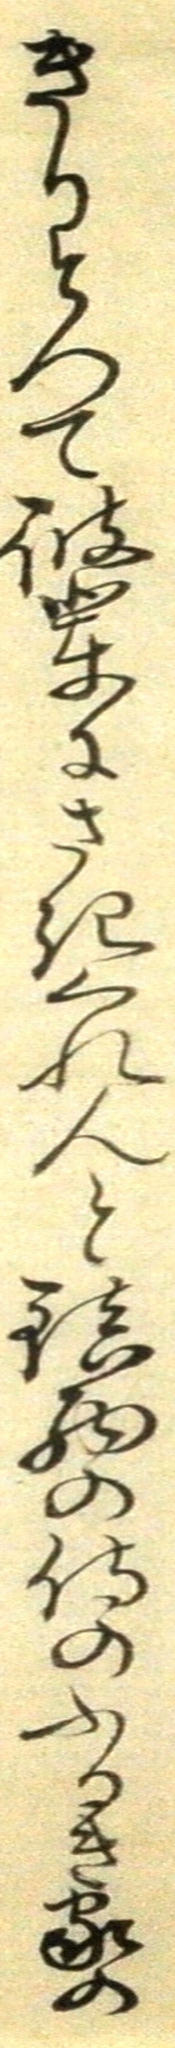きりとつて彼輩にさきくれんと鎮西の侍のふるき家の
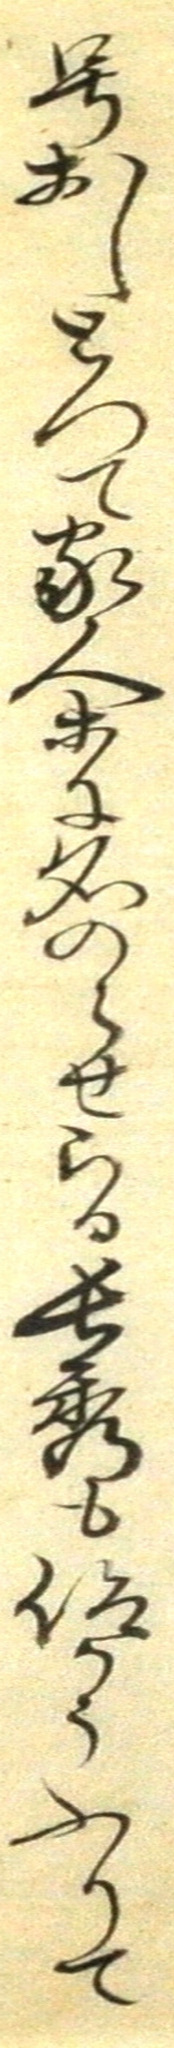号おしとつて家人に名のらせらる長秀も仰かうふりて
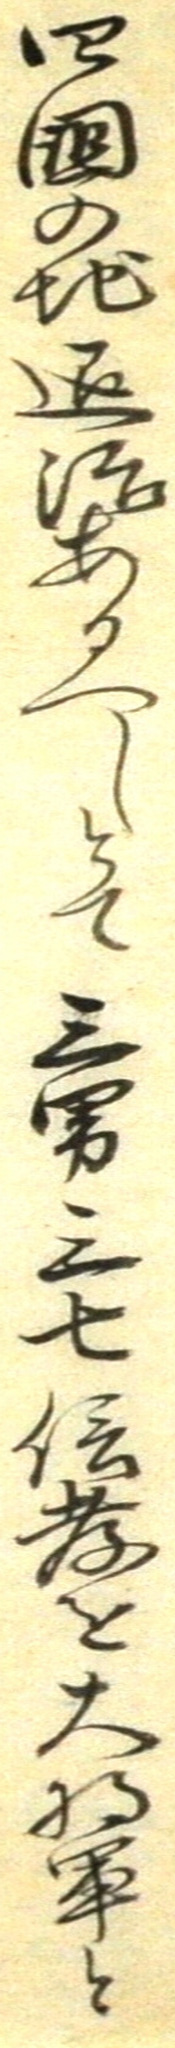四国の地退治あるへしとて三男三七信孝を大将軍と
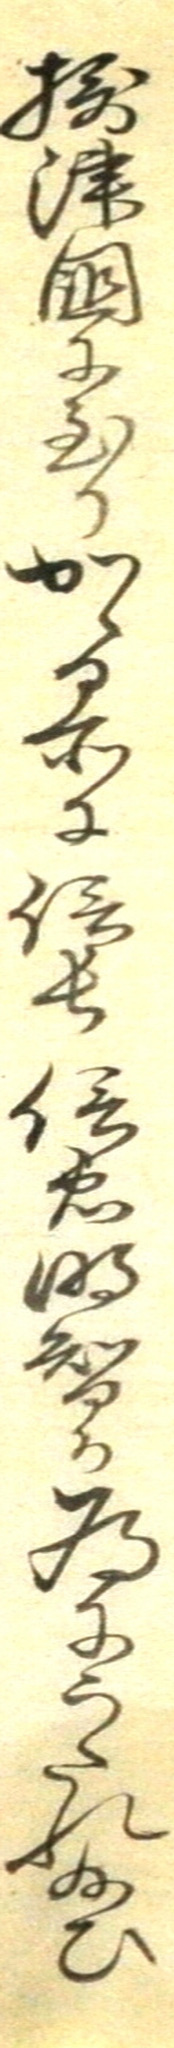摂津国に至りかゝる所に信長信忠明智か為にうたれ給ひ
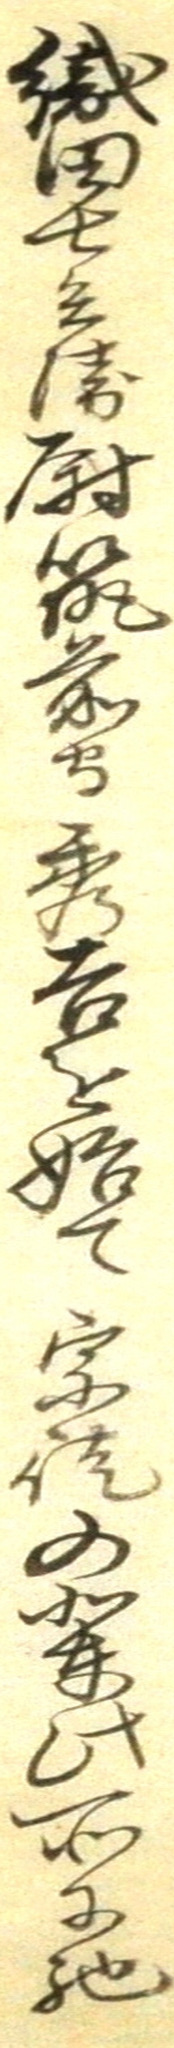織田七兵衛尉筑前守秀吉を始て宗徒の輩此所に馳
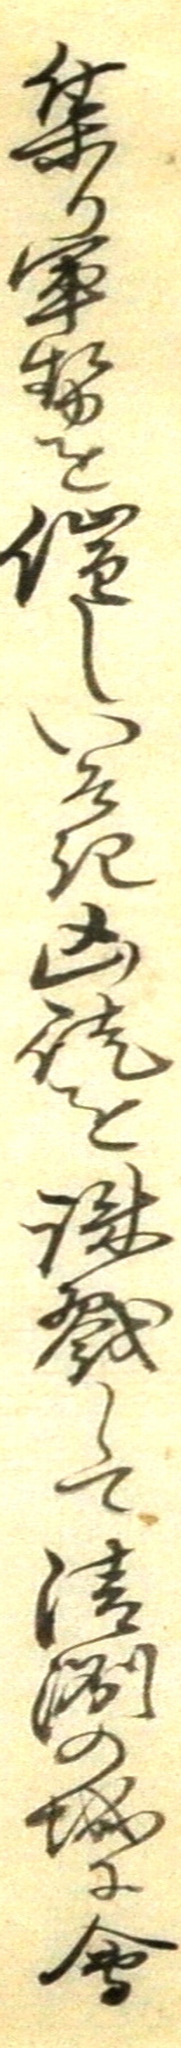集り軍勢を催しいそき凶徒を誅戮して清洲の城に会
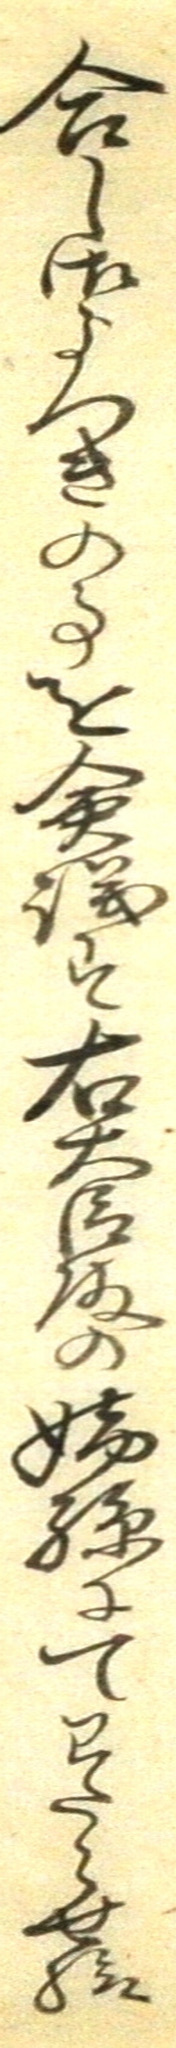合し御よつきの事を僉議す右大臣殿の嫡孫にてわたらせ給
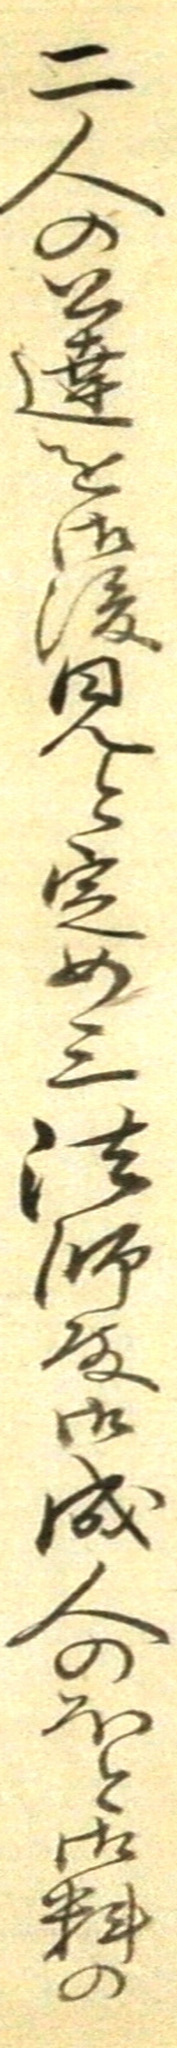二人の公達を御後見と定め三法師殿御成人のほと御料の
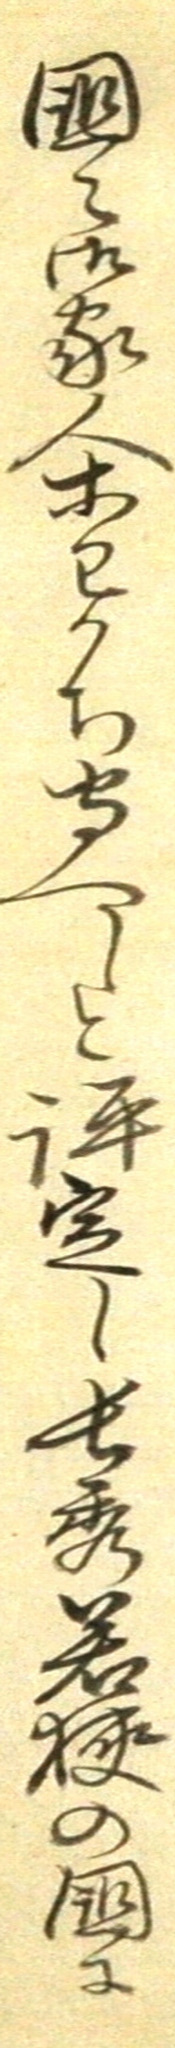国々御家人等わかち守へしと評定し長秀若狭の国に

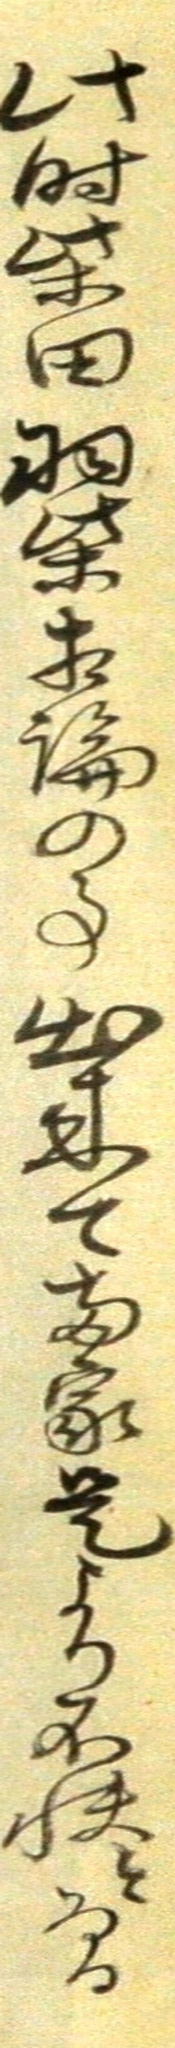此時柴田羽柴相論の事出来て両家是より不快となる
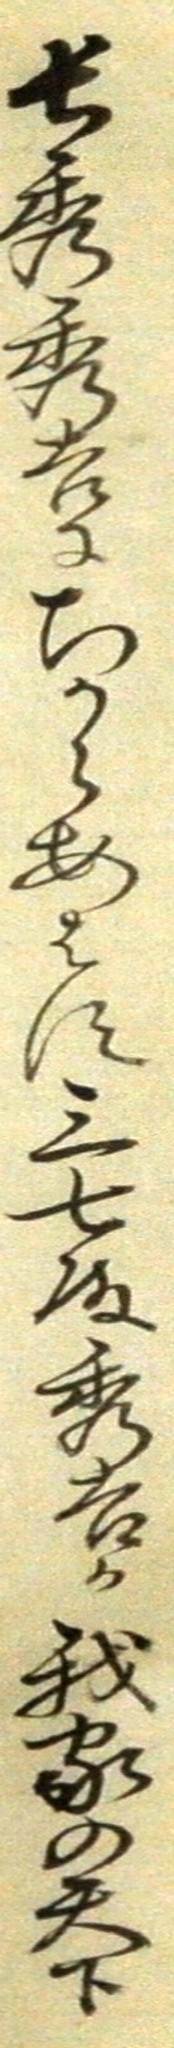長秀秀吉にちからあはす三七殿秀吉か我家の天下
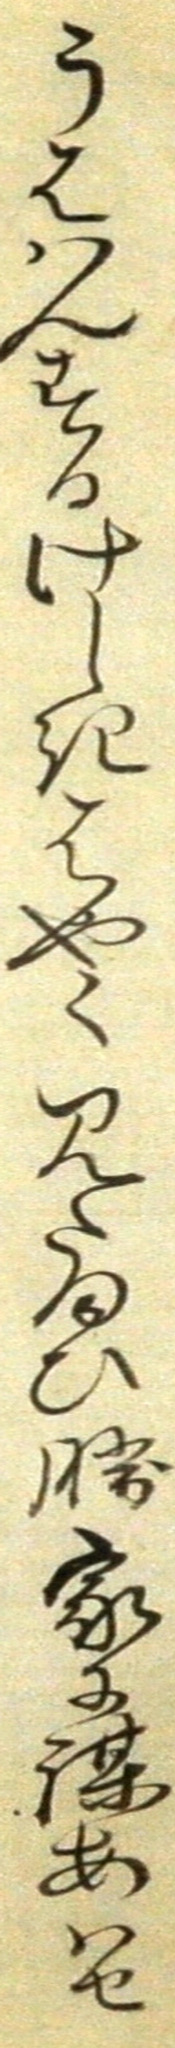うははんするけしきはやく見たまひ勝家に謀あはせ
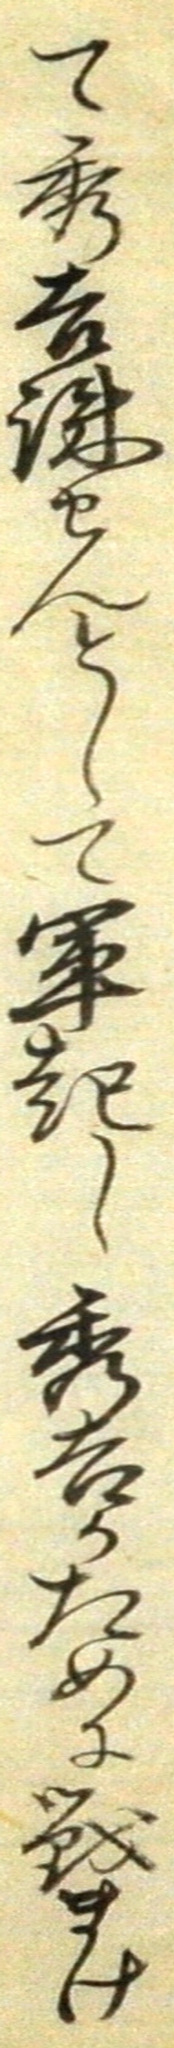て秀吉誅せんとして軍起し秀吉かために戦まけ
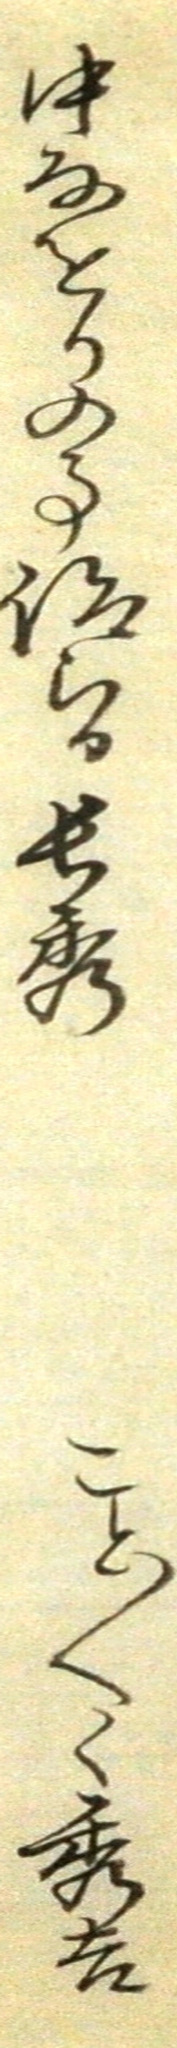中なをりの事仰らる長秀こと〳〵く秀吉
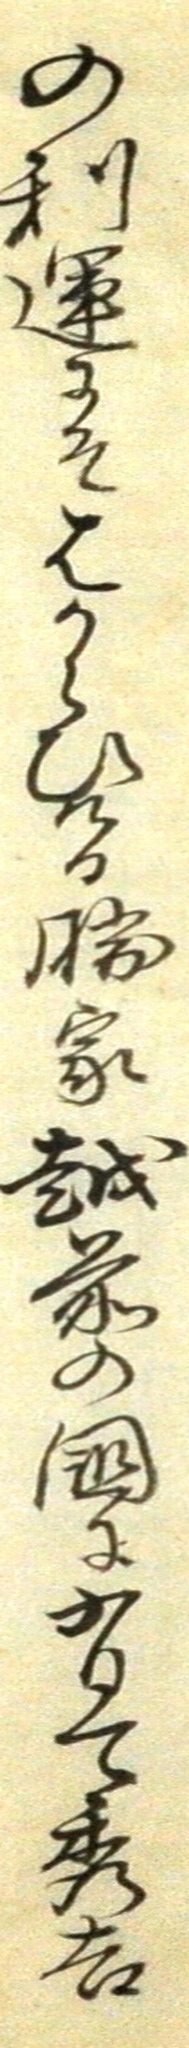の利運にそはからひける勝家越前の国に有て秀吉
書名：藩翰譜（八・下）
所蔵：伊那市立高遠町図書館・合同会社AMANE
